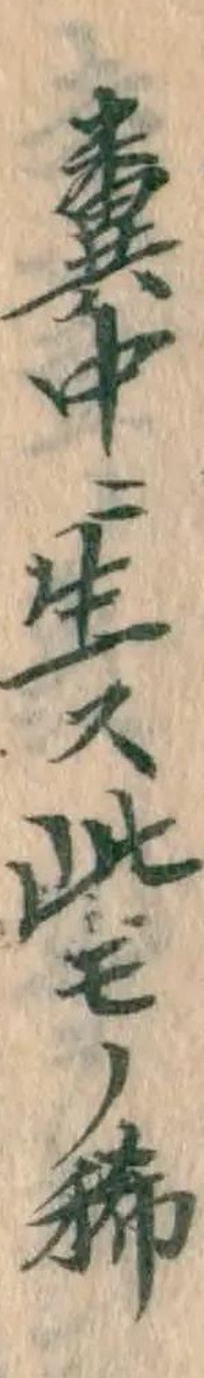糞中ニ生ス此モノ稀
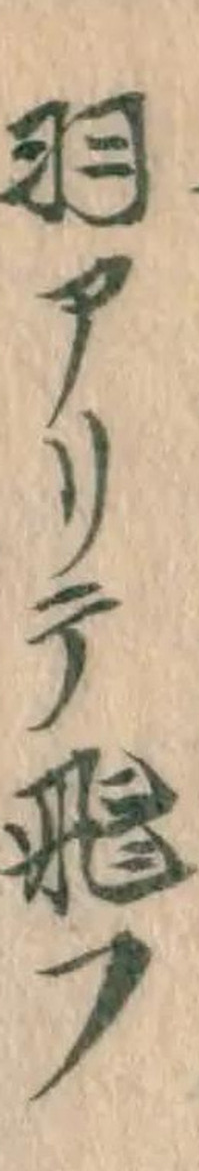羽アリテ飛フ
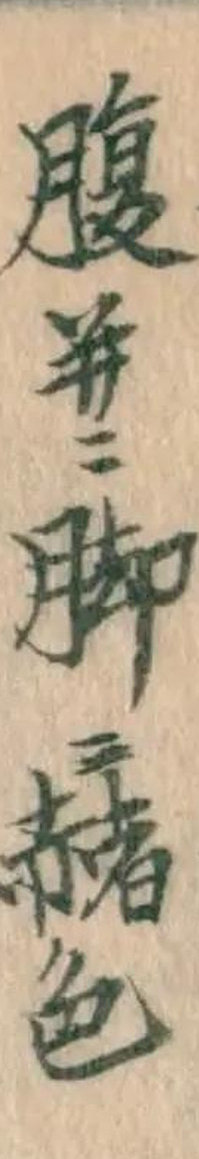腹并ニ脚ニ赭色
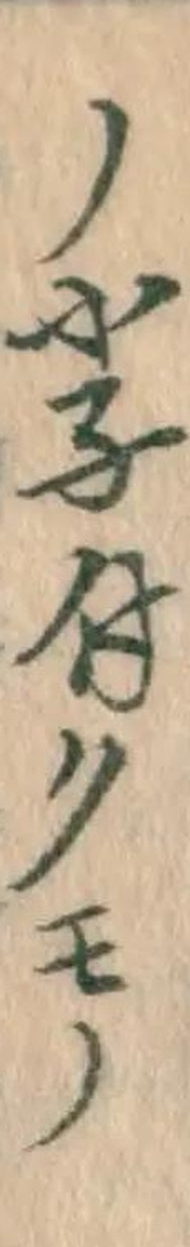ノ小子付クモノ
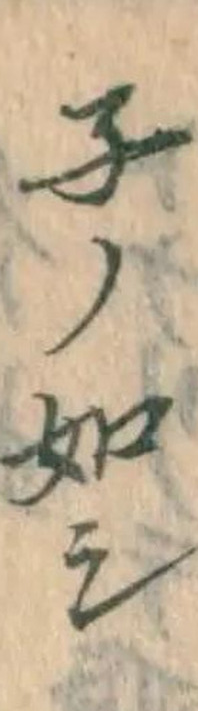子ノ如シ

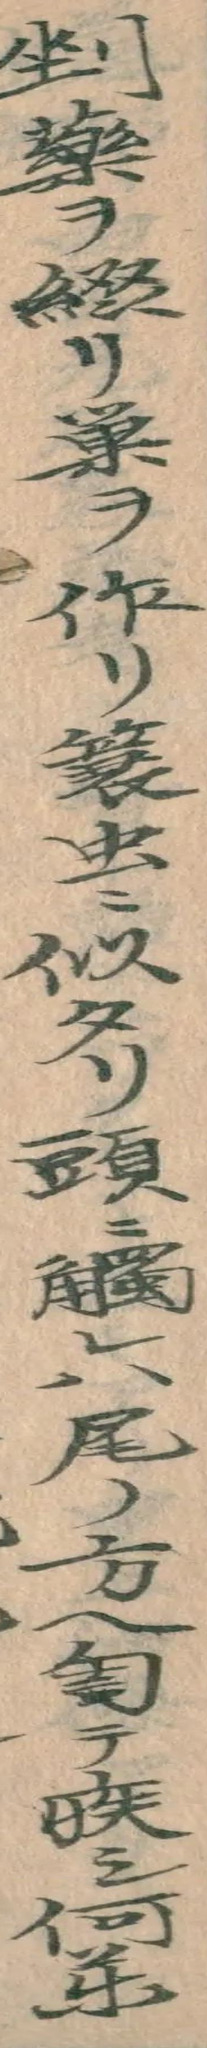剉薬ヲ綴リ巣ヲ作リ蓑虫ニ似タリ頭ニ触レハ尾ノ方ヘ訇テ疾シ何薬
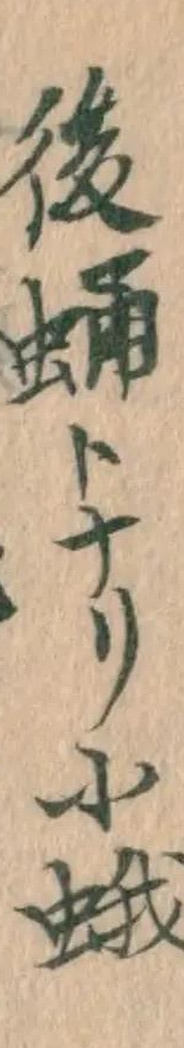後蛹トナリ小蛾
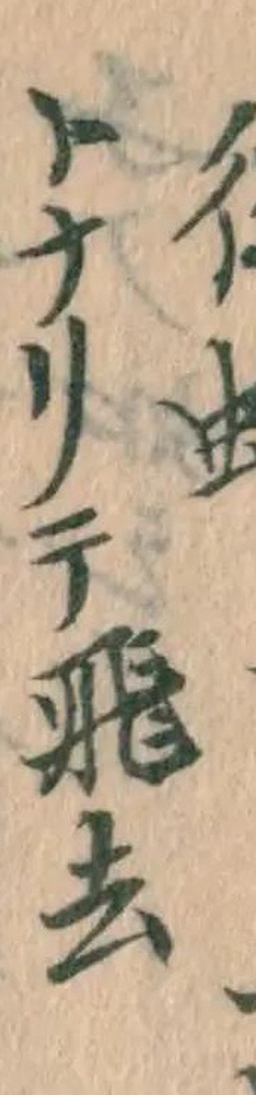トナリテ飛去
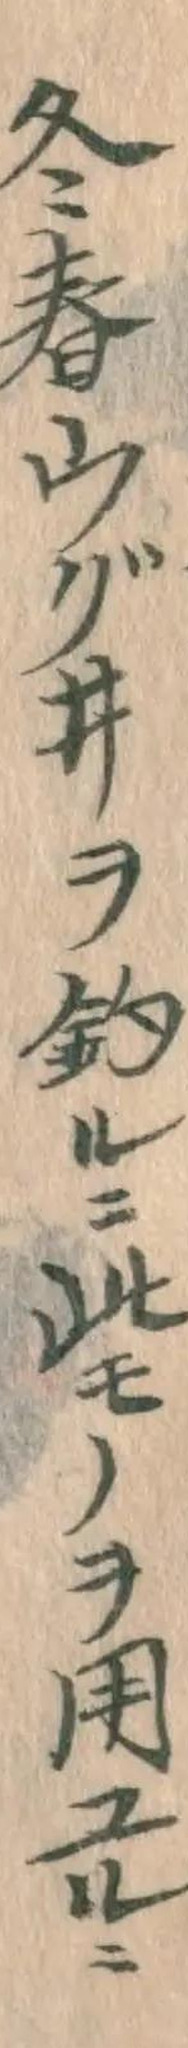冬春ウグヰヲ釣ルニ此モノヲ用ユルニ
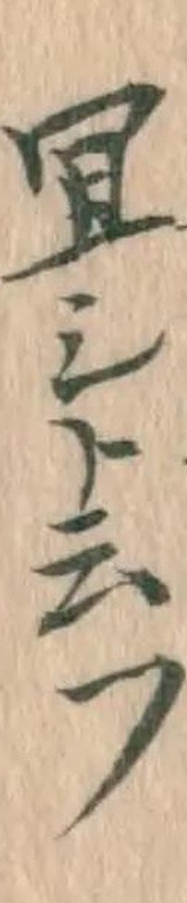宜シト云フ
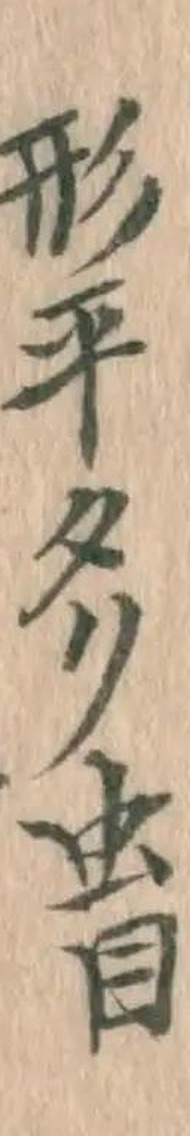形平タク虫目
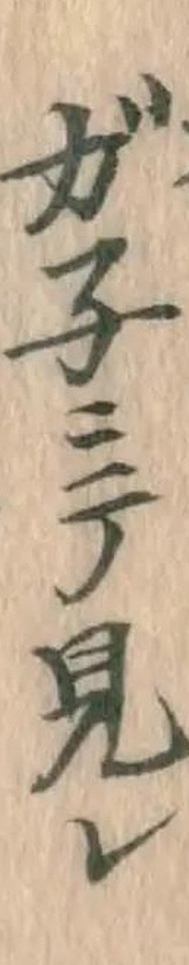ガネニテ見レ
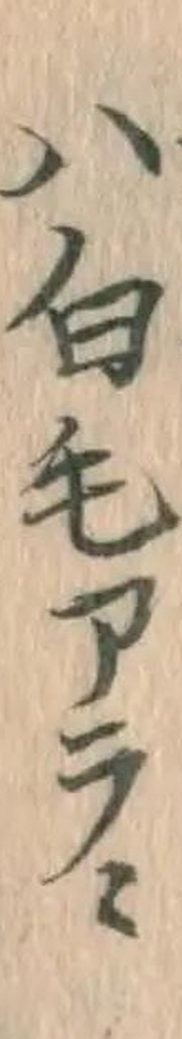ハ白毛アラ々
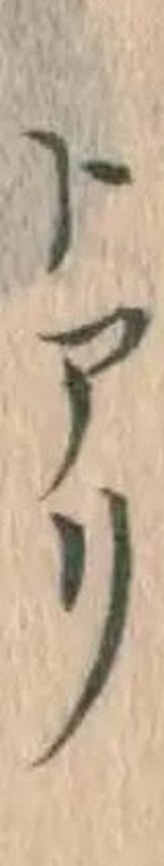トアリ
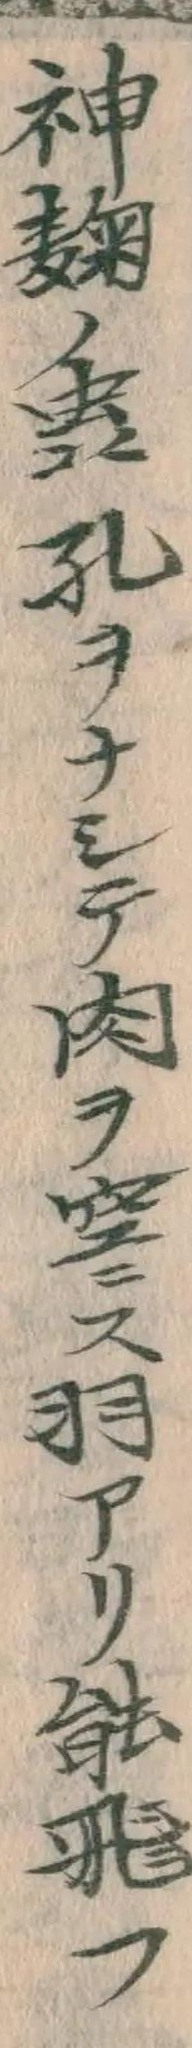神麹ノ蟲孔ヲナシテ肉ヲ空ニス羽アリ能飛フ
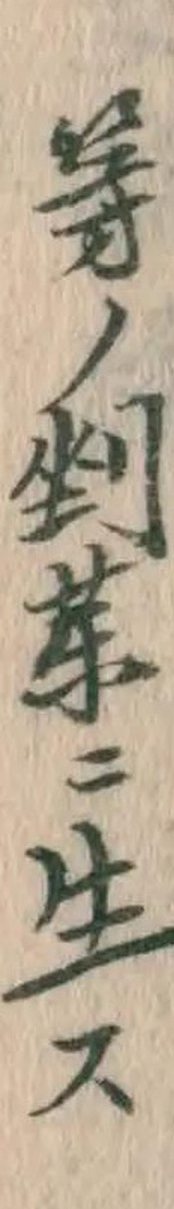等ノ剉薬ニ生ス
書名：千蟲譜 3巻. [3]
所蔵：国立国会図書館 National Diet Library, JAPAN
